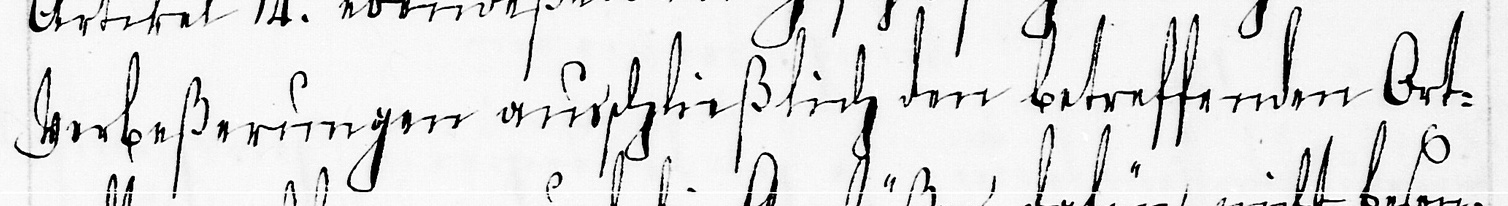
Verbeßerungen ausschließlich den betreffenden Ort¬
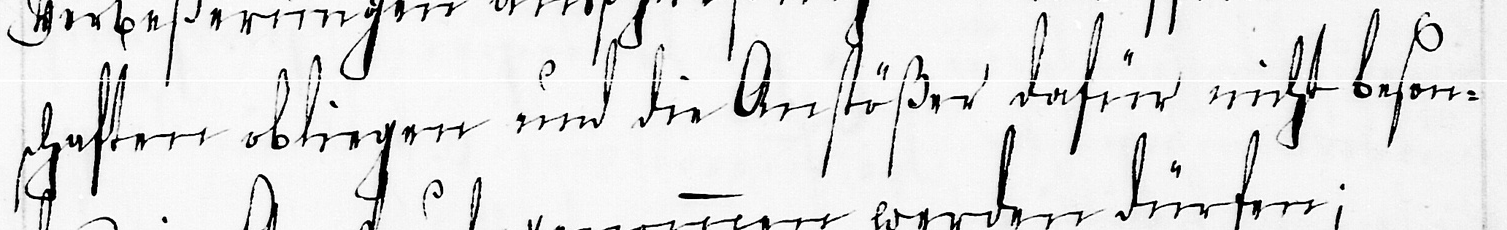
schaften obliegen und die Anstößer dafür nicht beson¬
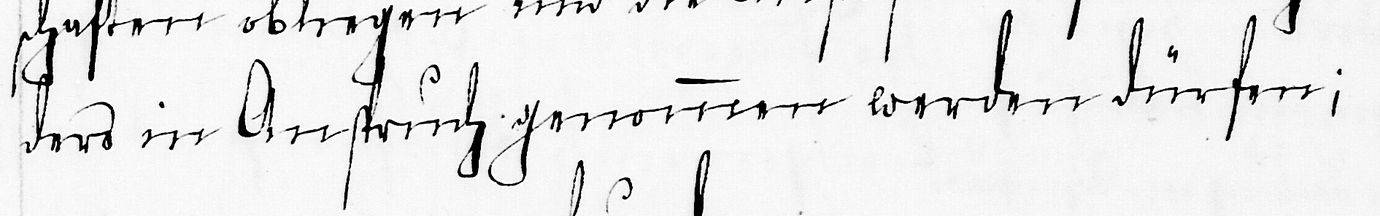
ders in Anspruch genommen werden dürfen;
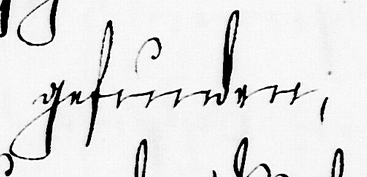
gefunden;
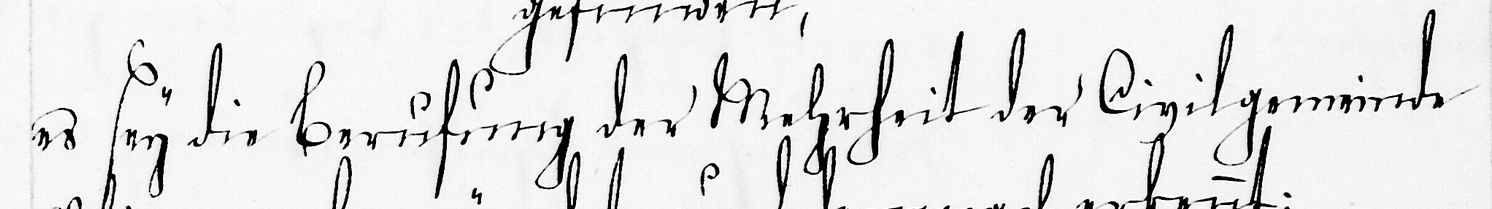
es sey die Berufung der Mehrheit der Civilgemeinde
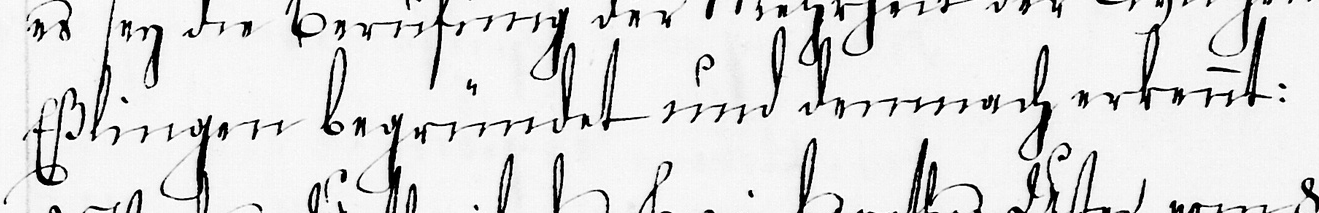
Eßlingen begründet und demnach erkennt:
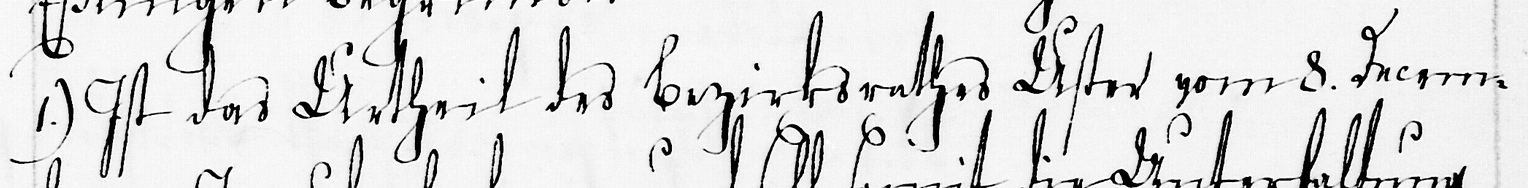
1.) Ist das Urtheil des Bezirksrathes Uster vom 8. Decem¬
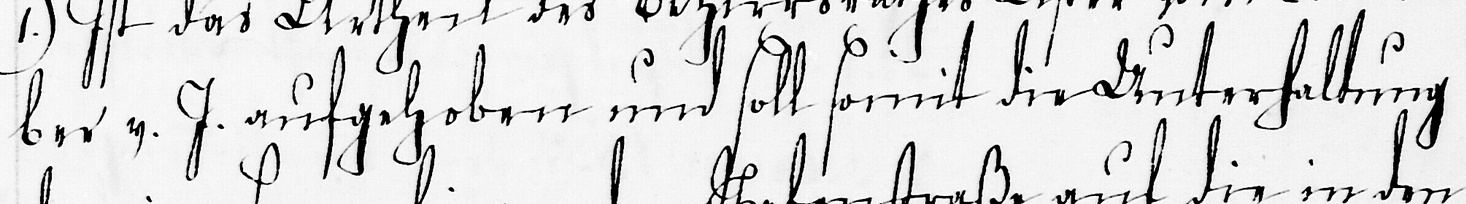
ber v. J. aufgehoben und soll somit die Unterhaltung
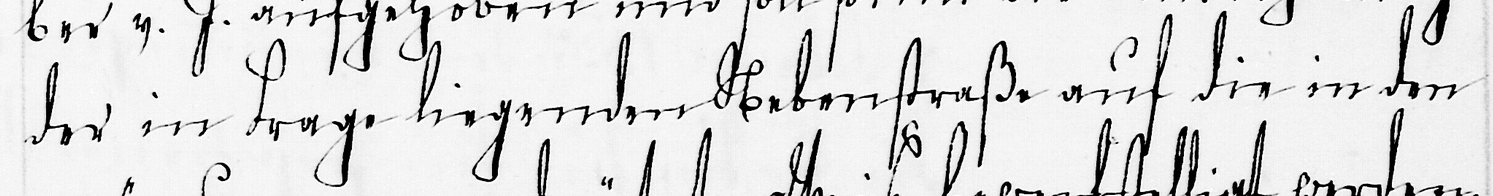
der in Frage liegenden Nebenstraße auf die in den
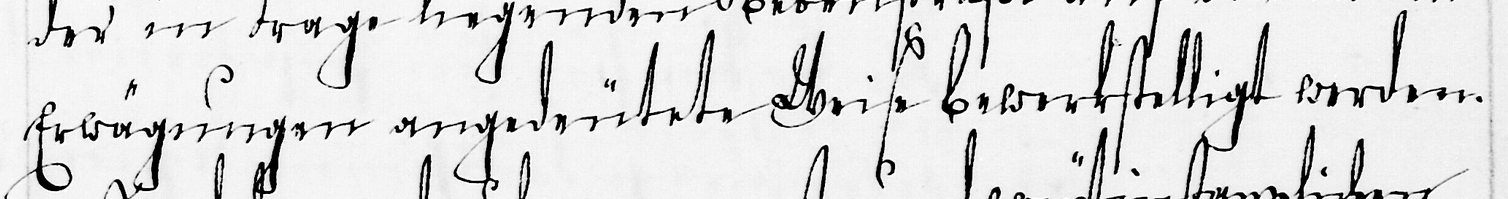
Erwägungen ausgedeutete Weise bewerkstelligt werden.
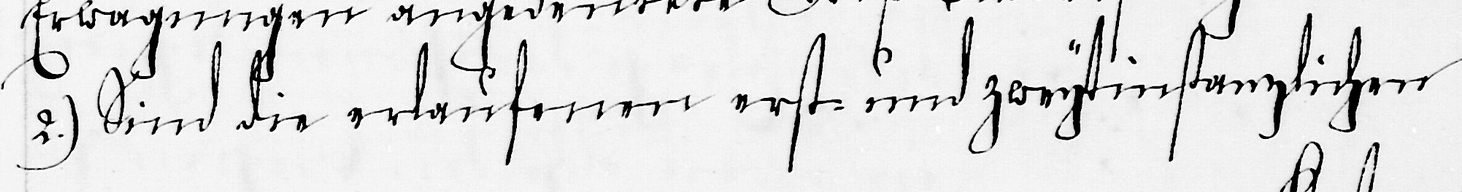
2.) Sind die erlaufenen erst- und zweytinstanzlichen
